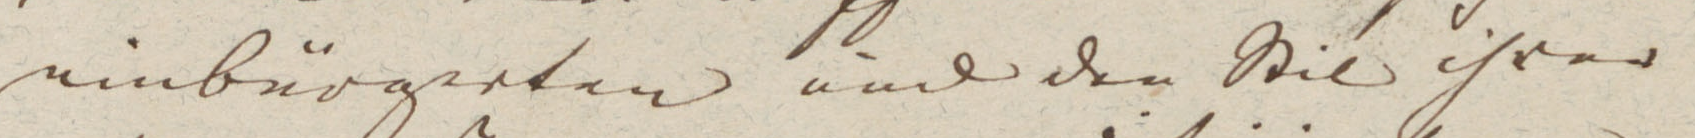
einbürgerten und den Stil ihrer
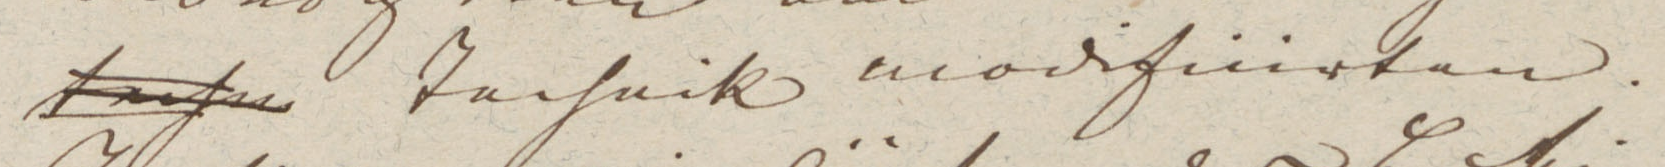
techn Technik modificirten.
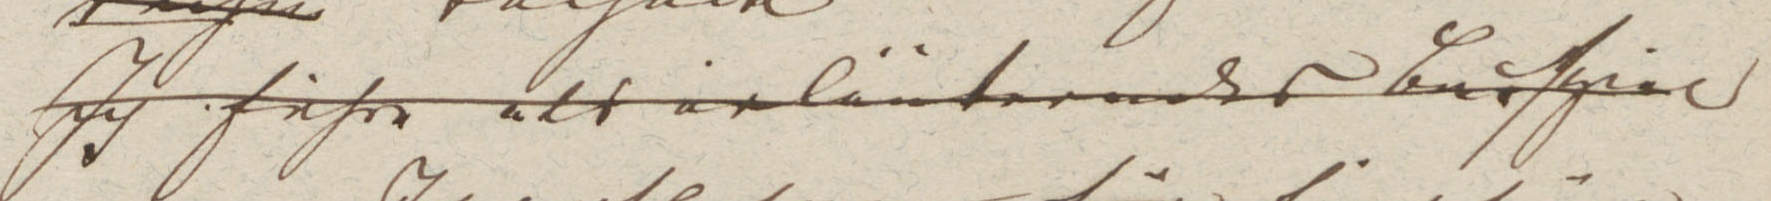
Ich führe als erläuterndes Beispiel
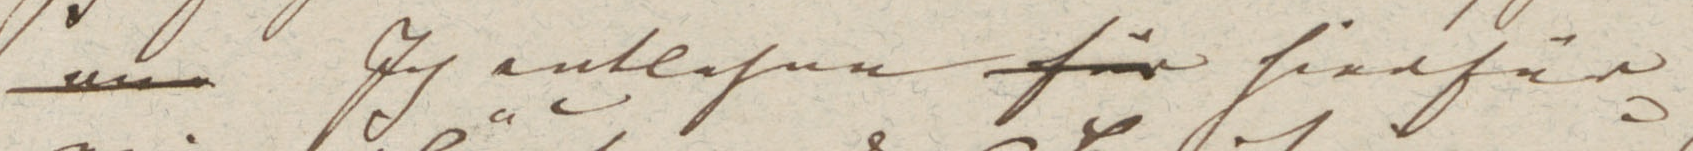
au Ich entlehne für hierfür
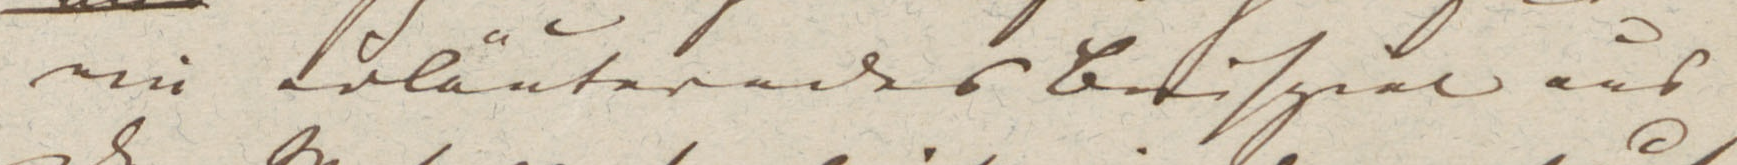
ein erläuterndes Beispiel aus
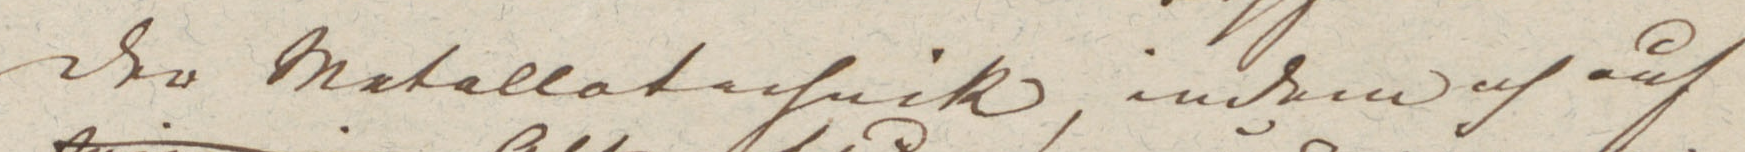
der Metallotechnik, indem ich auf
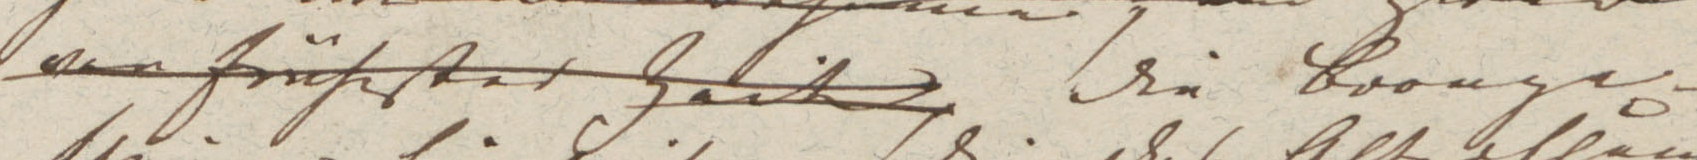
von frühester Zeit, die Bronze-
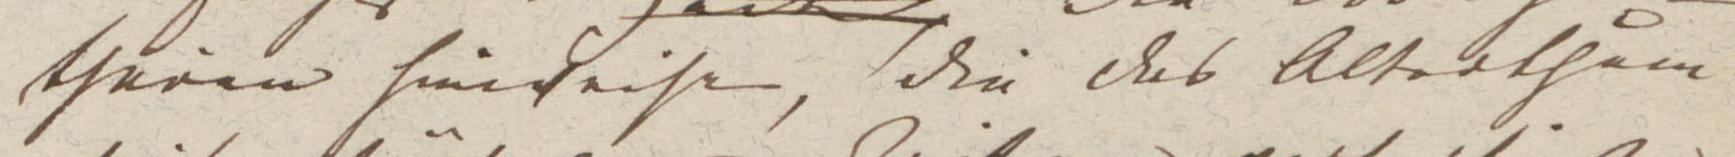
thüren hinweise, die das Alterthum
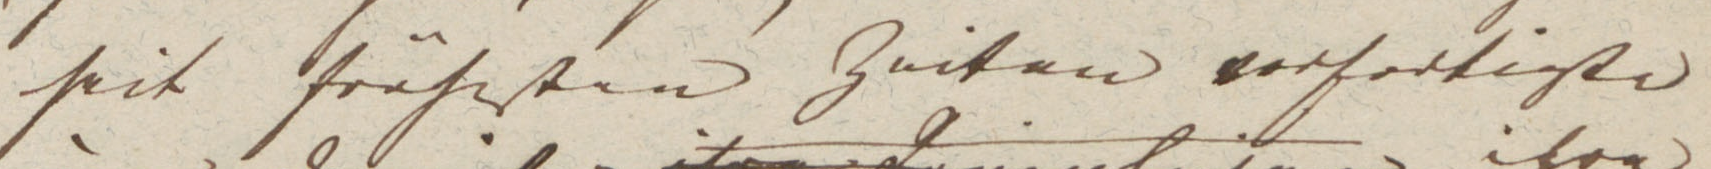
seit frühesten Zeiten verfertigte
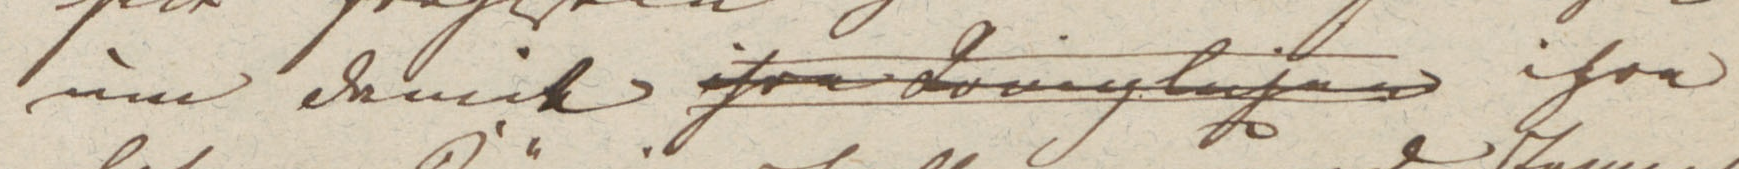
um damit ihre Königlichen ihre
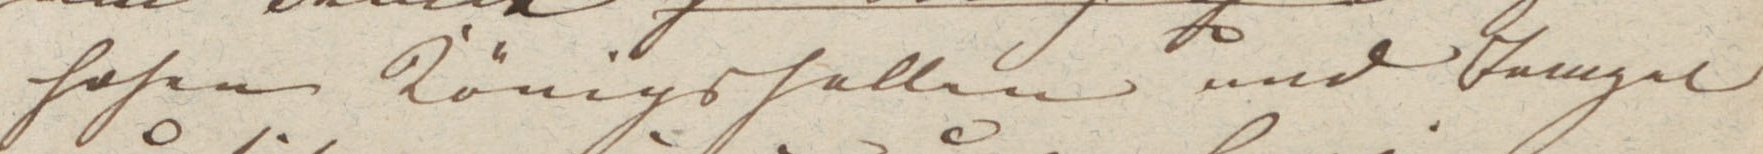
hohen Königshallen und Tempel
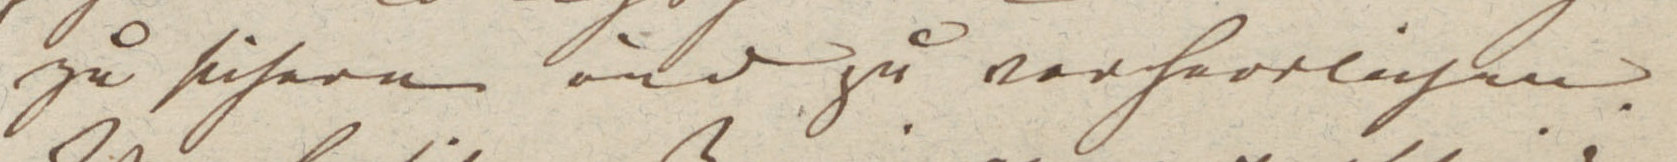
zu sichern und zu verherrlichen.
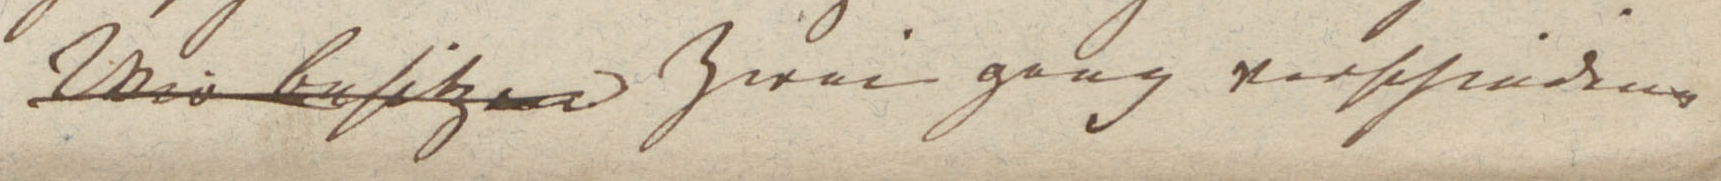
Wir besitzen Zwei ganz verschiedene
